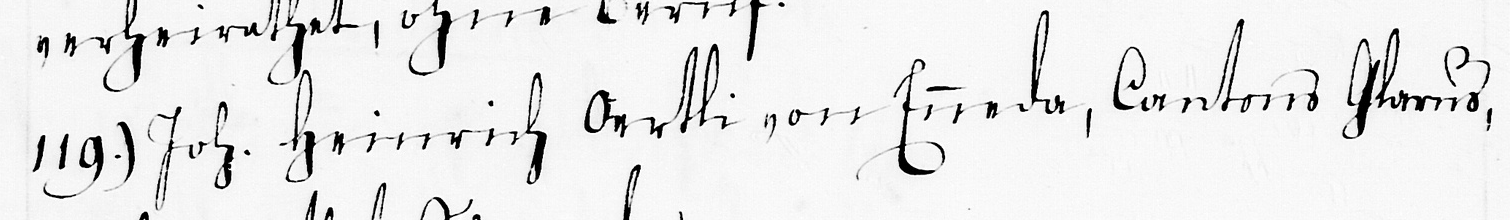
119.) Joh. Heinrich Oertli von Enneda, Cantons Glarus,
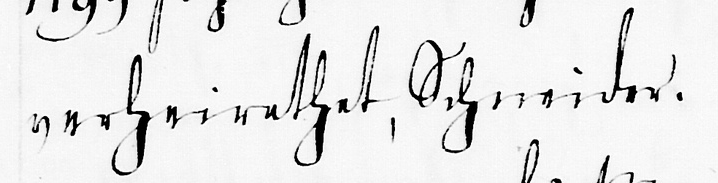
verheirathet, Schneider.
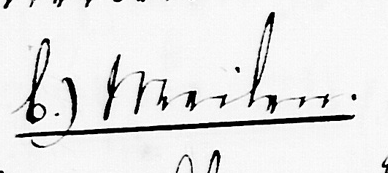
b.) Meilen.
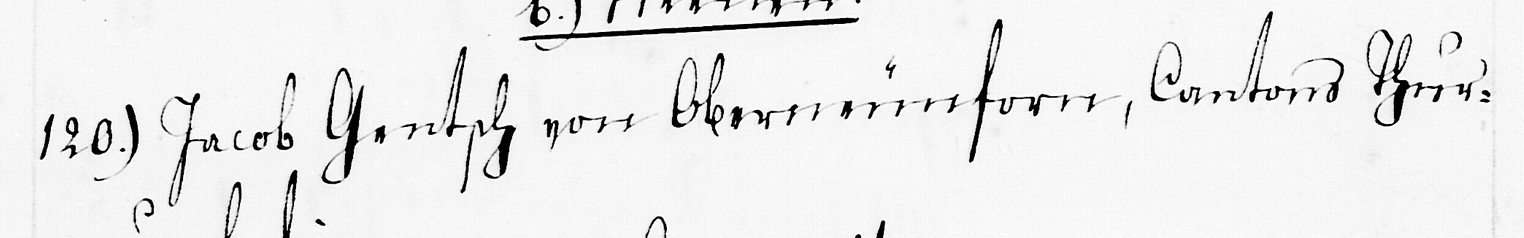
120.) Jacob Gentsch von Oberneünform, Cantons Thur¬
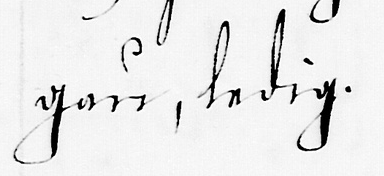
gau, ledig.
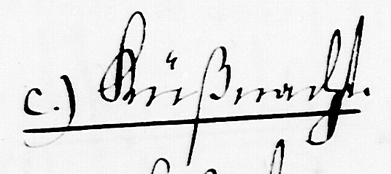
c.) Küßnacht.
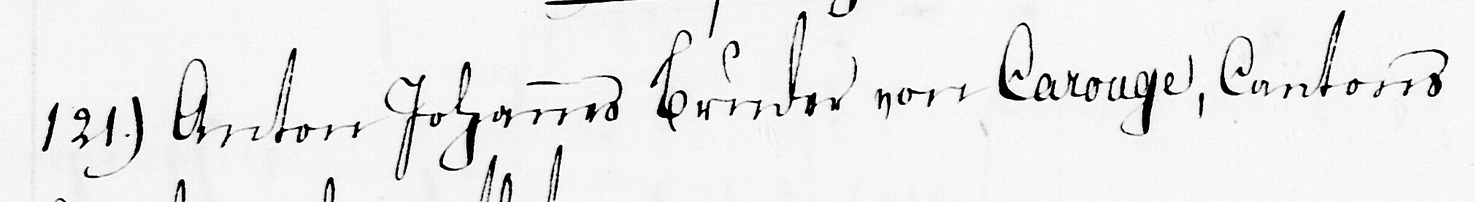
121.) Anton Johannes Bruder von Carouge, Cantons
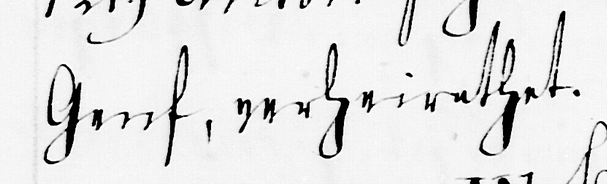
Genf, verheirathet.
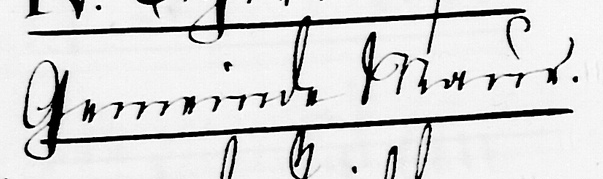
Gemeinde Maur.
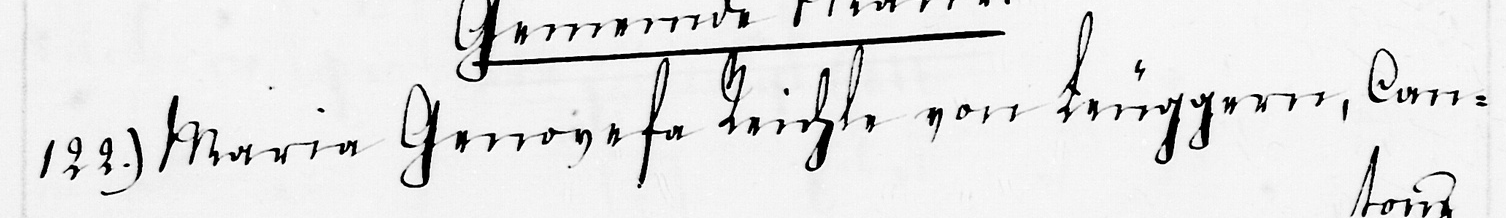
122.) Maria Genovefa Reichle von Leuggern, Can-
